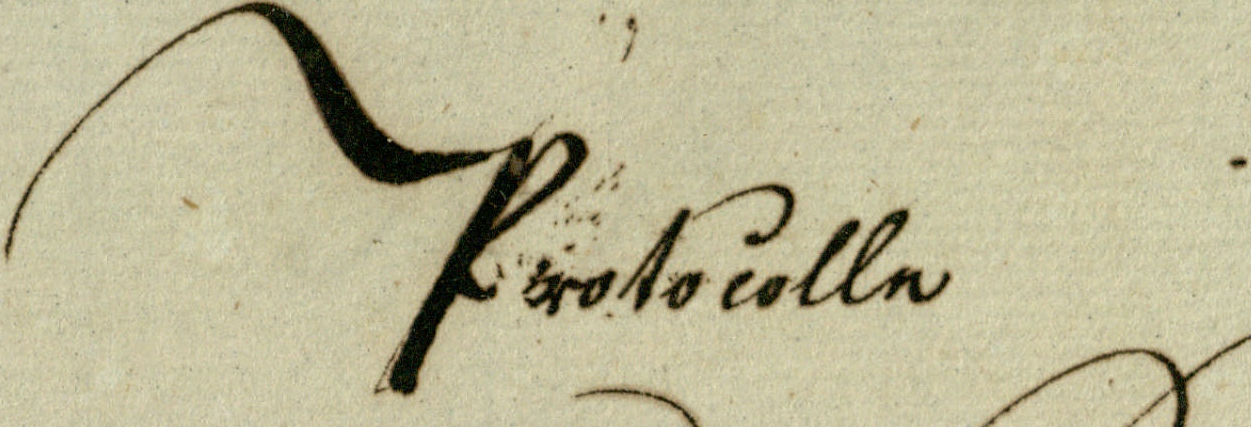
Protocolle
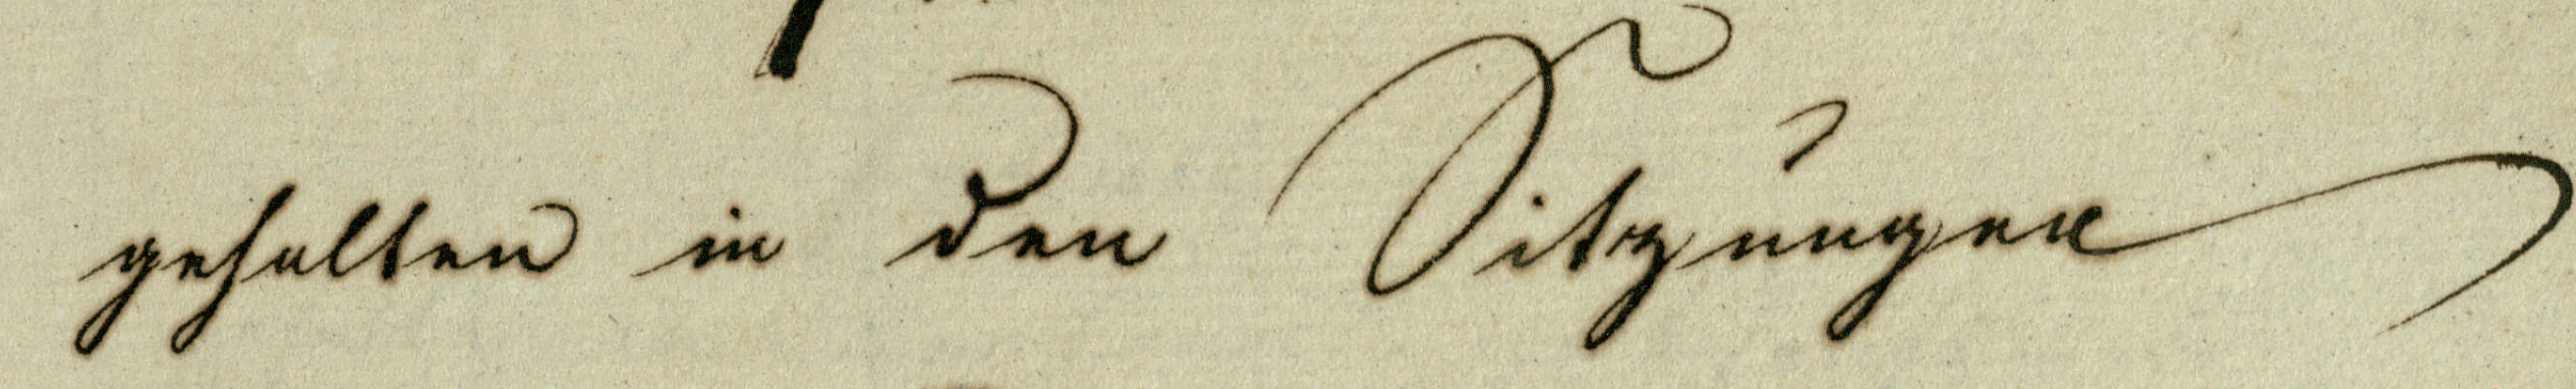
gehalten in den Sitzungen
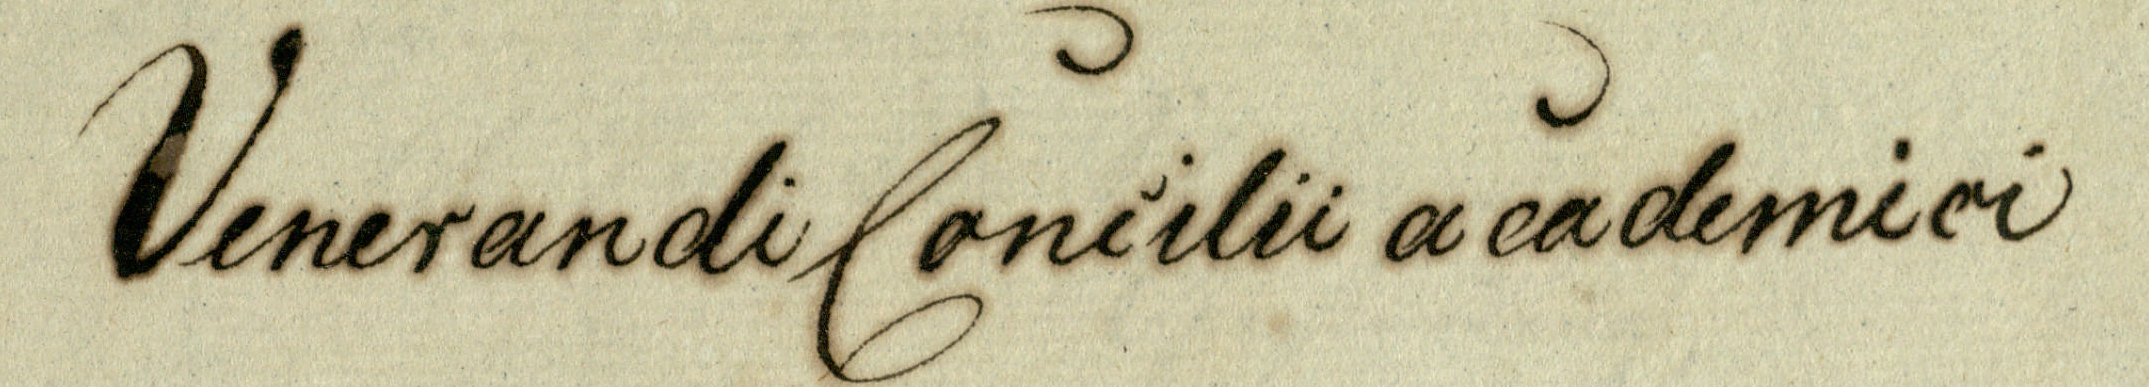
Venerandi Concilii academici
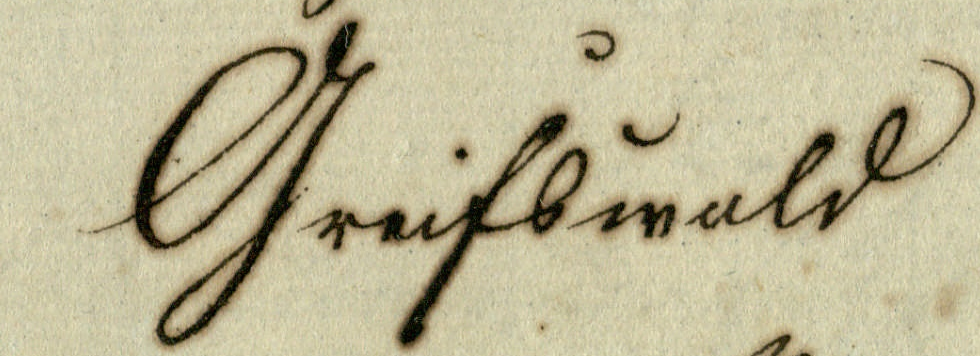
Greifswald
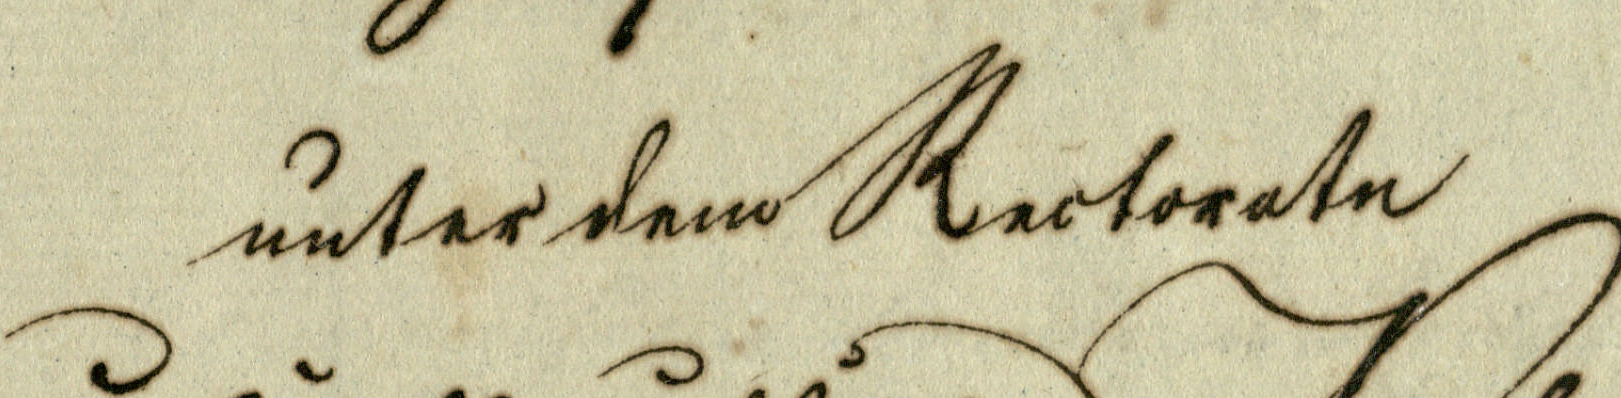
unter dem Rectorate
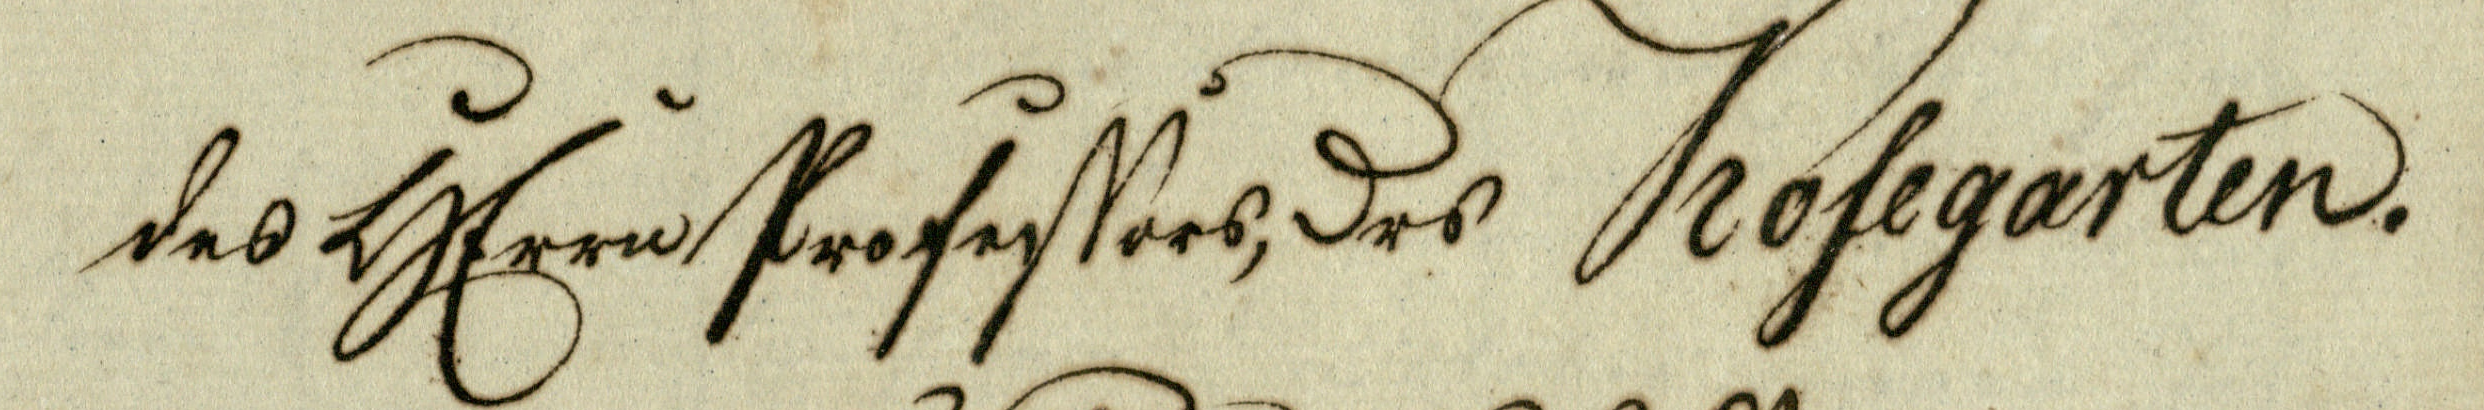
des HErrn Professors, Drs Kosegarten.
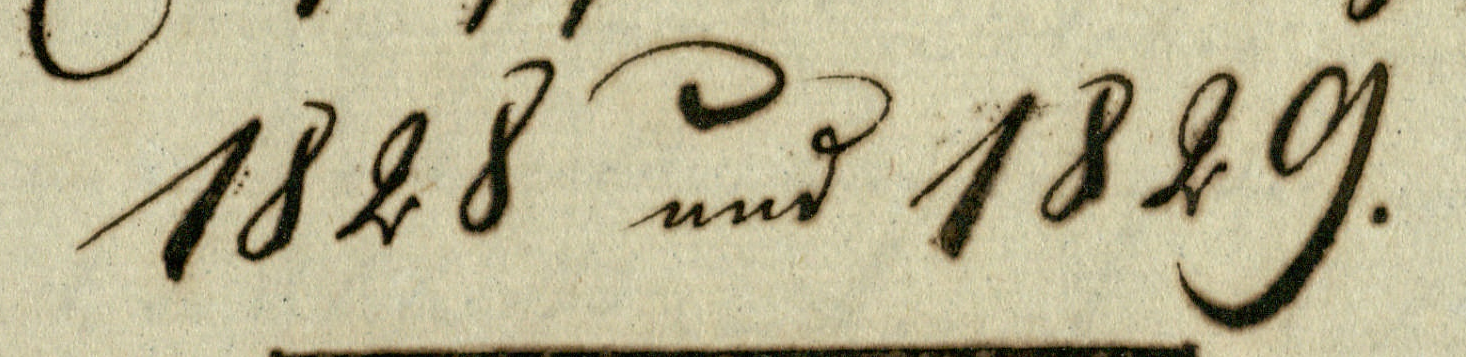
1828 und 1829
